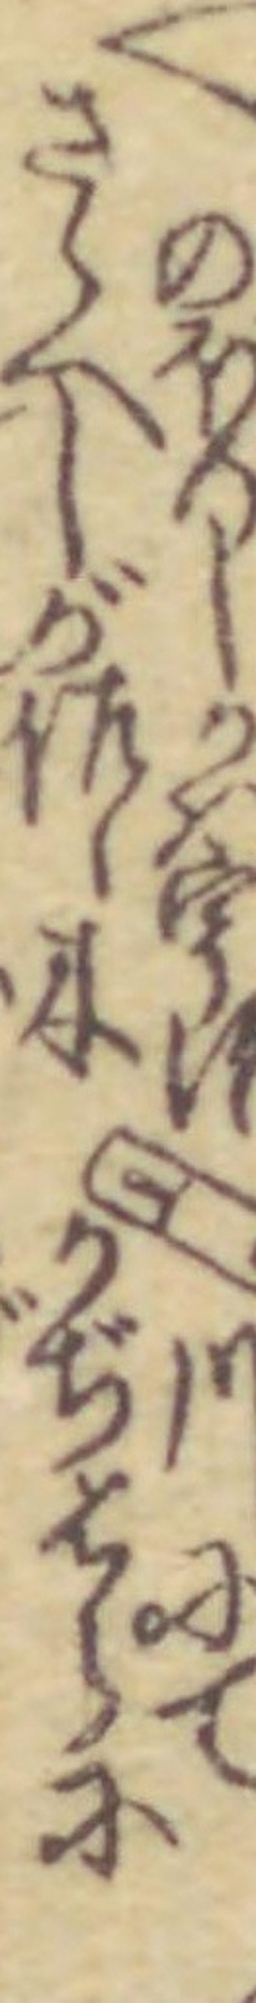さゝへしが佐々木かぢはらに
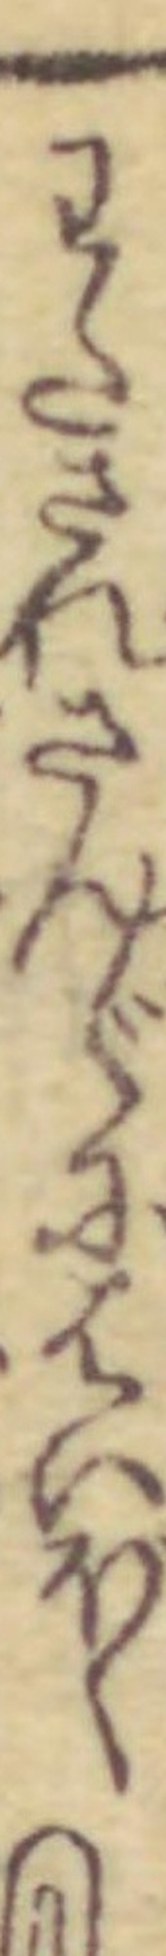わたされさん〴〵にはいぼく
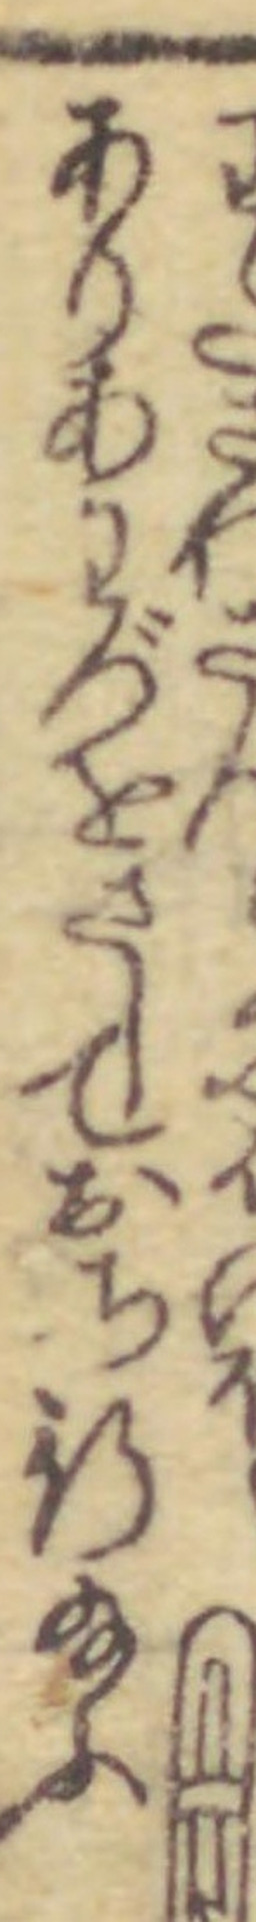ありあわづをさしておち行給ふ
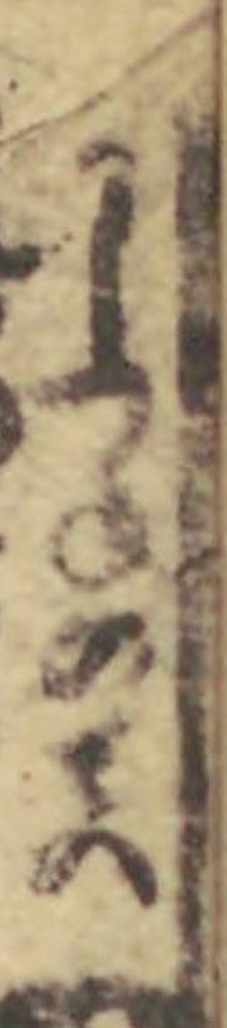よしつねのては
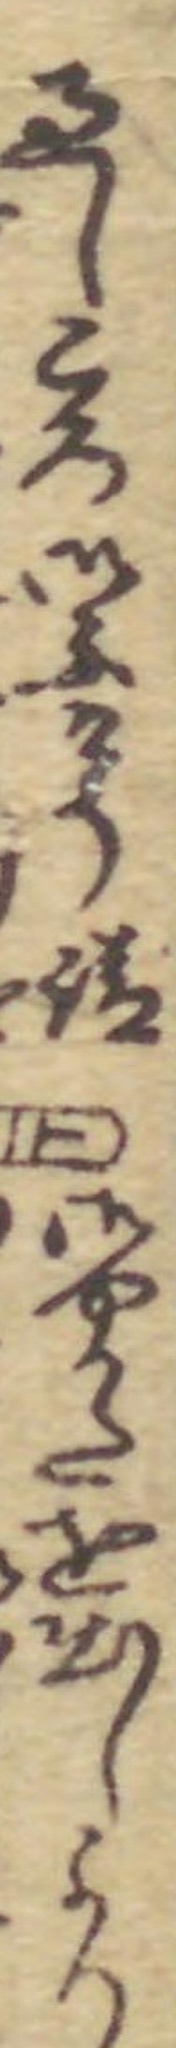過しころ御ふけう請御やかたを出しより
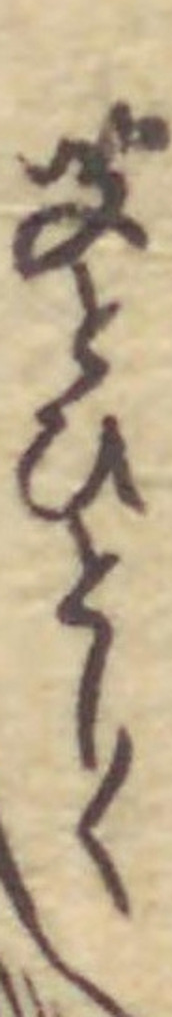聞とひとしく
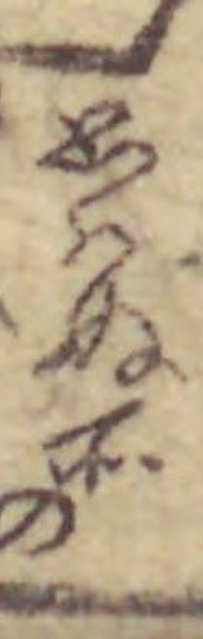思はぬ所の
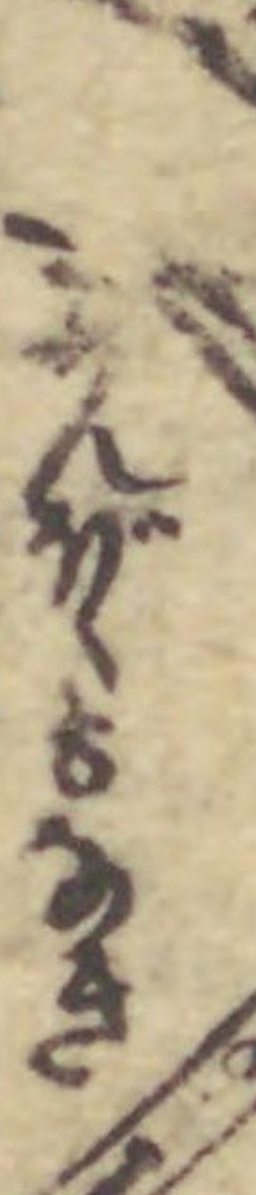めんぼくもなき
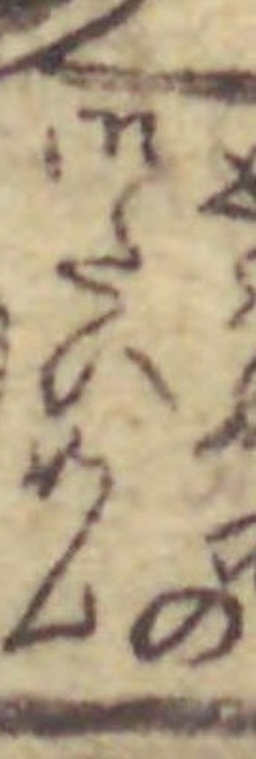御たいめん
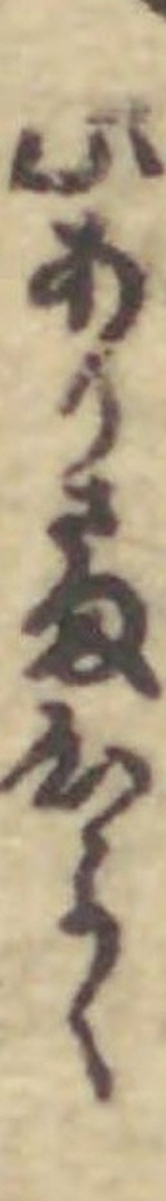此ありさま心よく
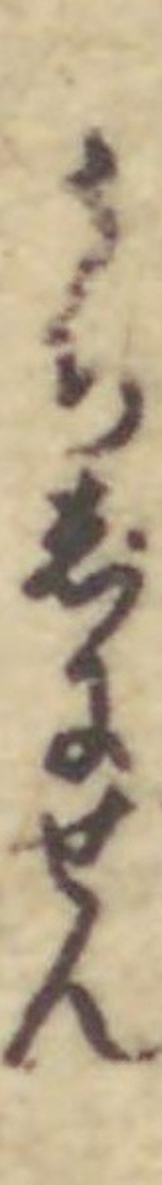うちじにせん
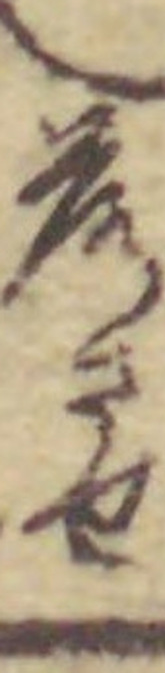落させ
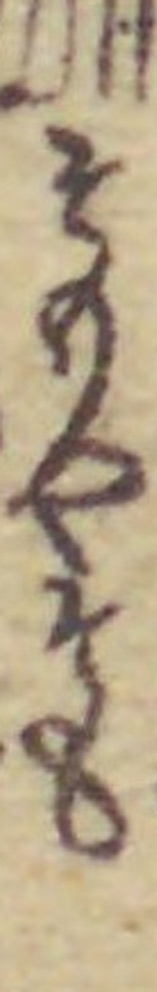そもやそも
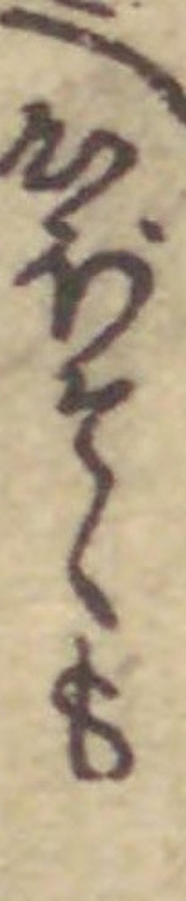心ぼそくも
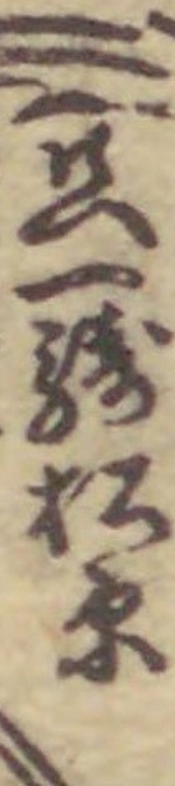只一騎松原
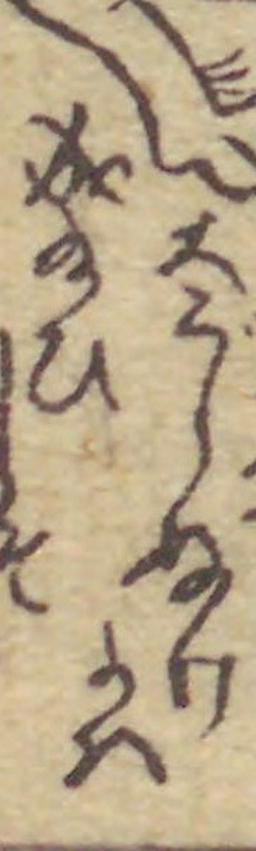成給ひしそ
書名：朝比奈草摺実記 2巻
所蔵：国立国会図書館 National Diet Library, JAPAN
